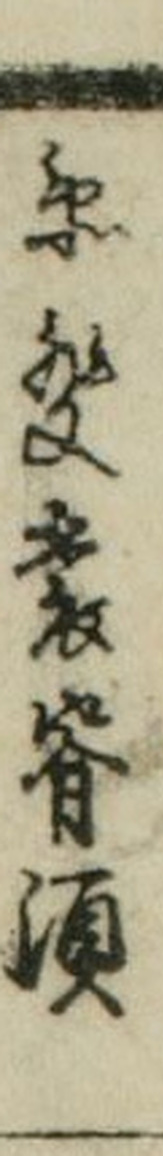衛斐裳背須
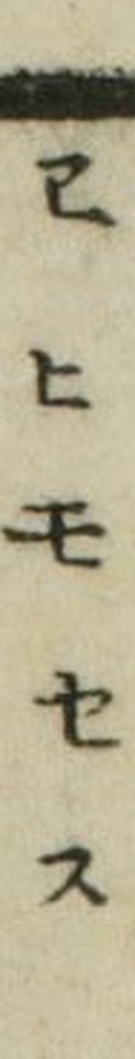ヱヒモセス
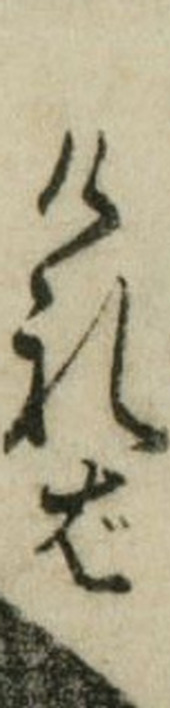ければ
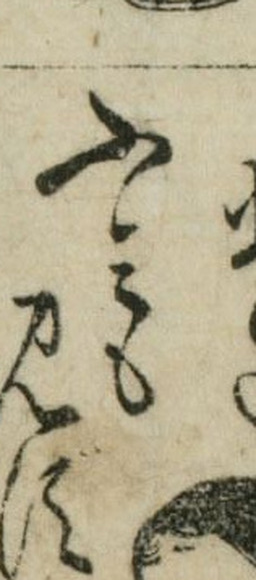ふみも
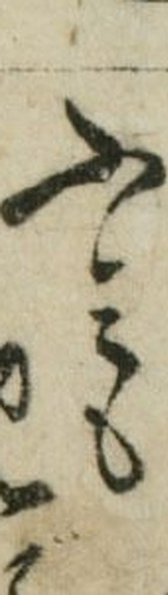ふみも
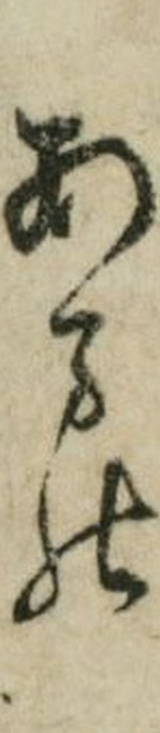あまの
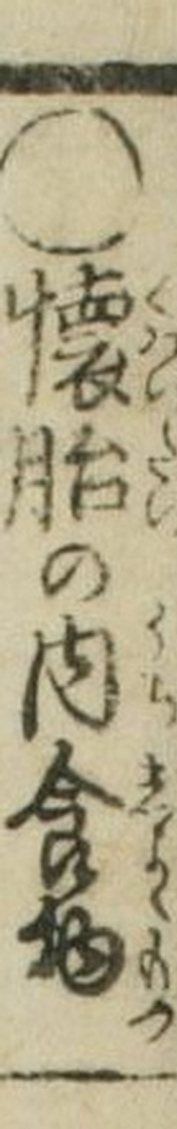○懐胎の内食物
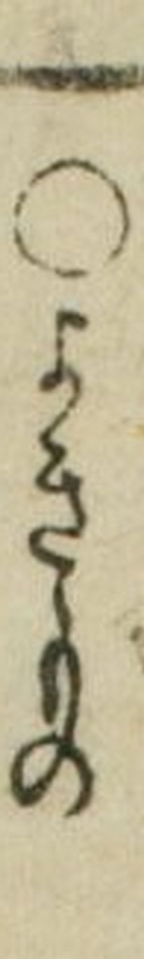○よきもの
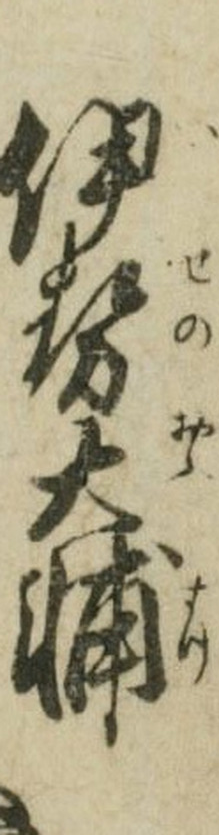伊勢大輔
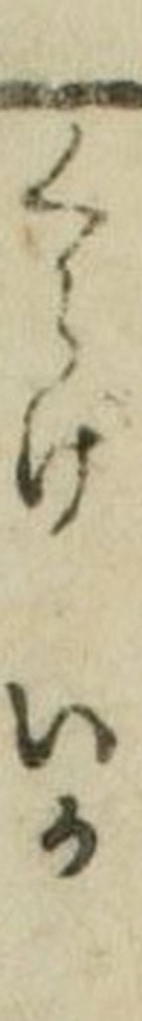くらけいか
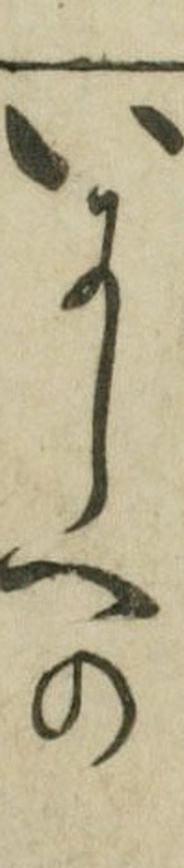いにしへの
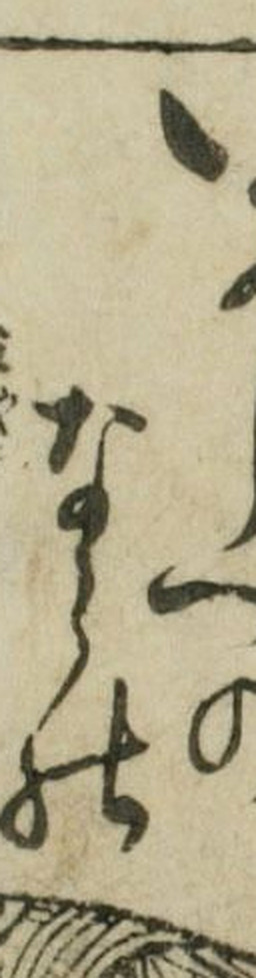ならの
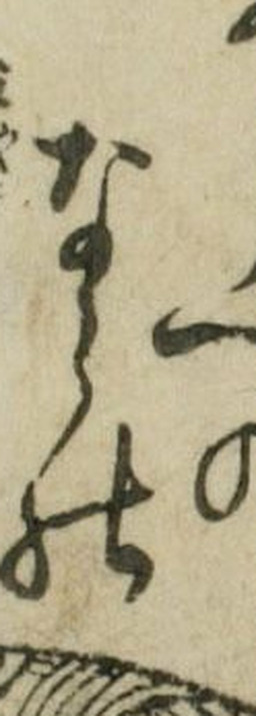ならの
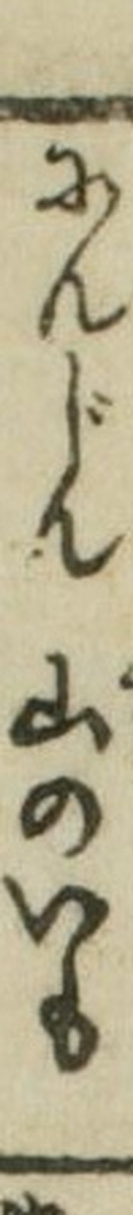にんじん山のいも
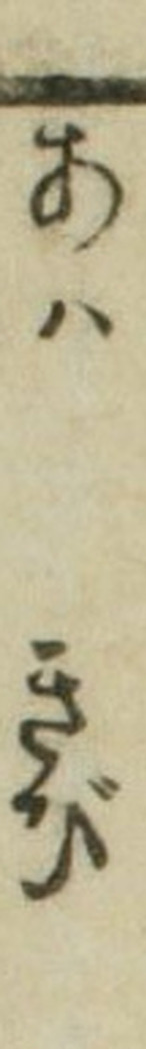あはきび
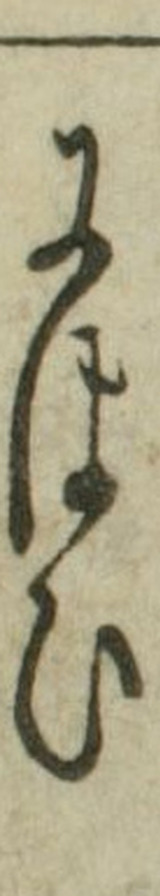にほひ
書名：百人一首
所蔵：東京学芸大学教育コンテンツアーカイブ
